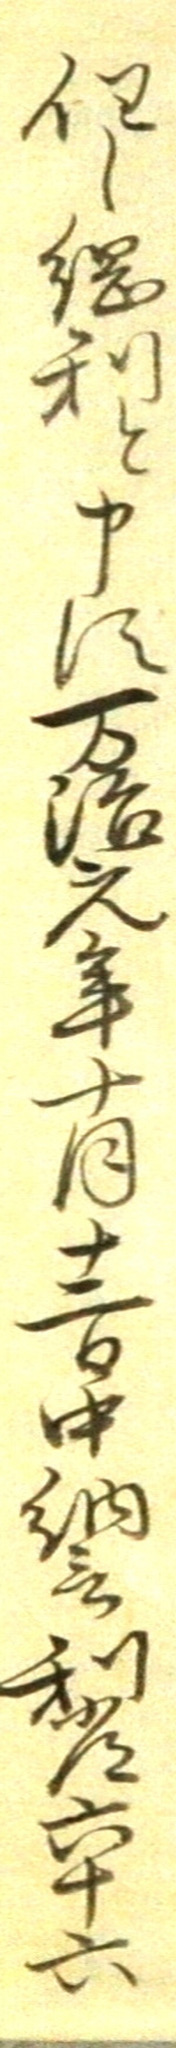任し綱利と申す万治元年十月十二日中納言利常六十六
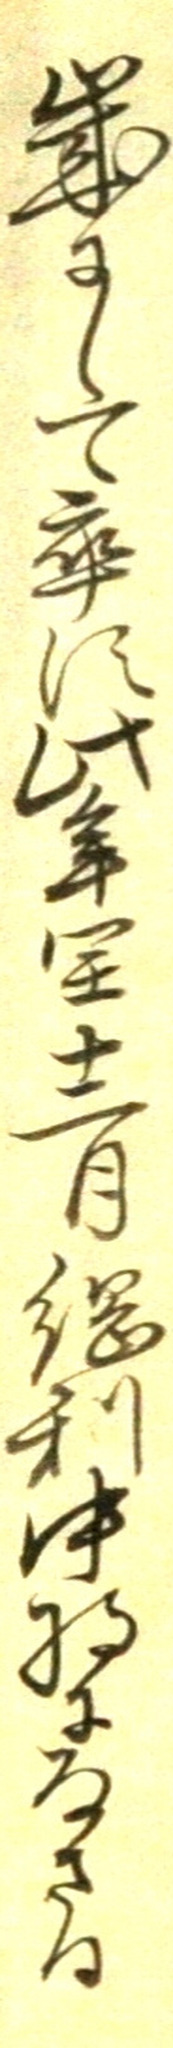歳にして卒す此年閏十二月綱利中納言になさる

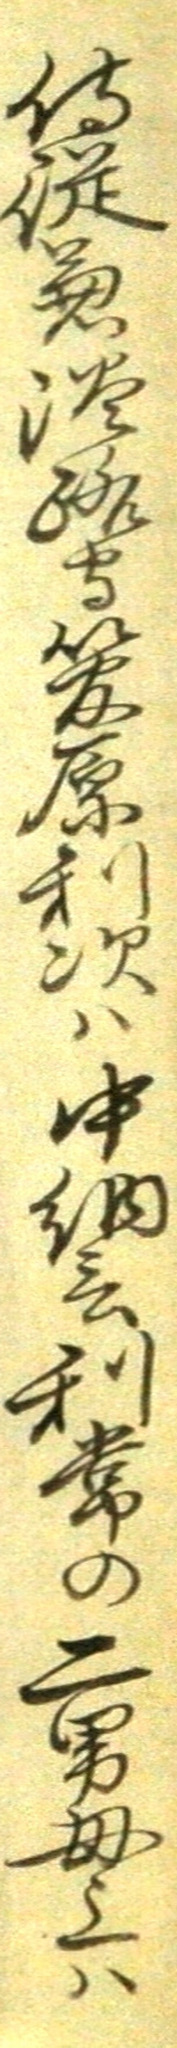侍従兼淡路守菅原利次は中納言利常の二男母上は
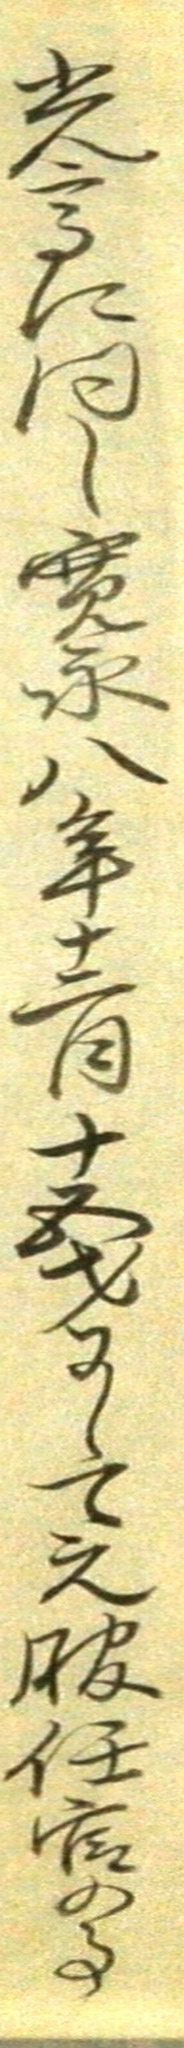光高に同し寛永八年十二月十五才にして元服任官の事
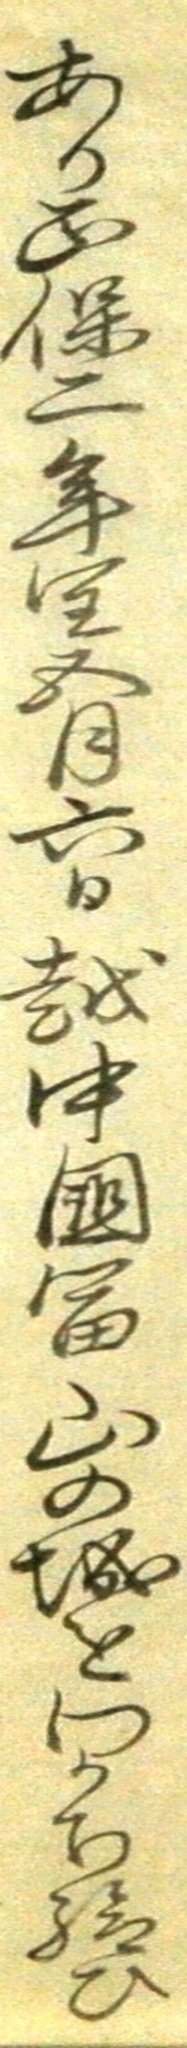あり正保二年閏五月六日越中国富山の城をわかち給ひ
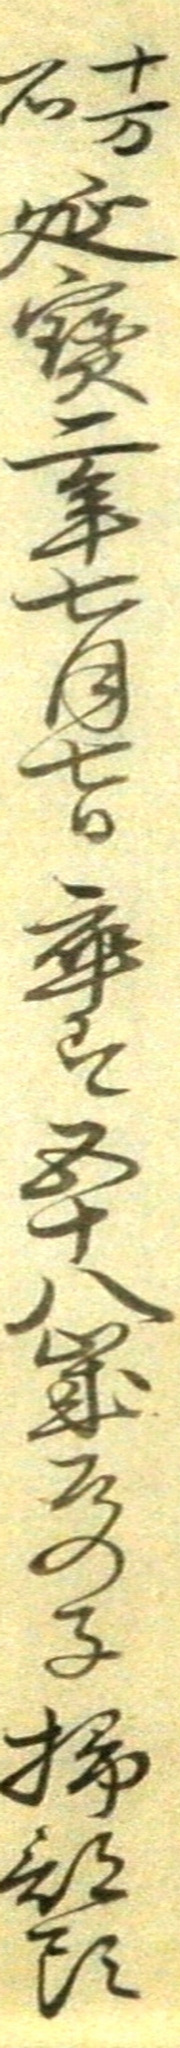十万石延宝二年七月七日卒す五十八歳その子掃部頭
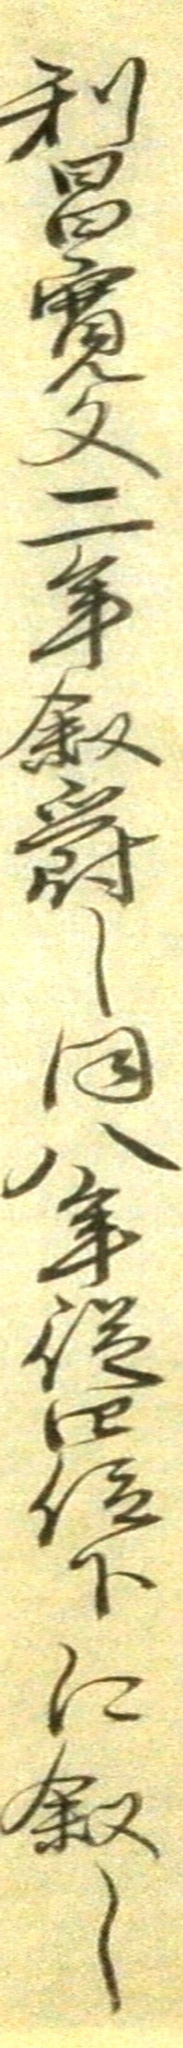利昌寛文二年叙爵し同八年従四位下に叙し
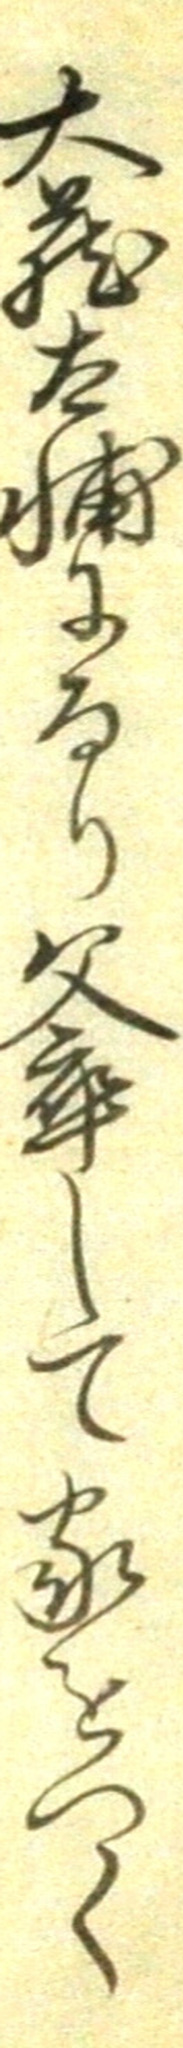大蔵太輔になり父卒して家をつく
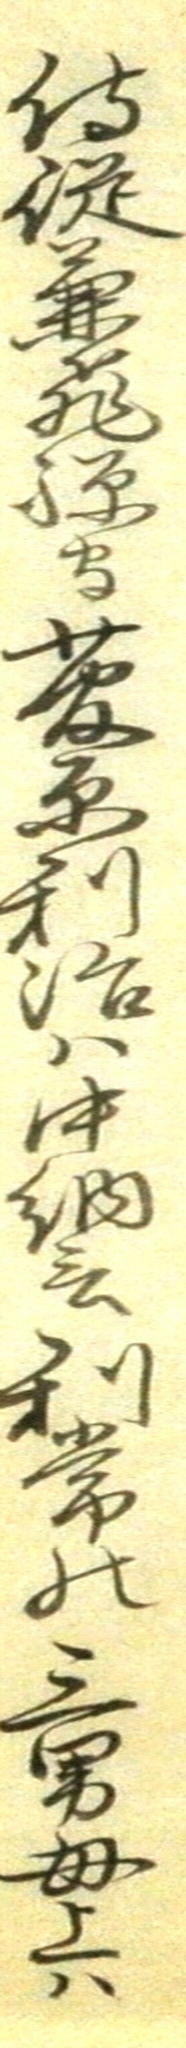侍従兼飛騨守菅原利治は中納言利常の三男母上は
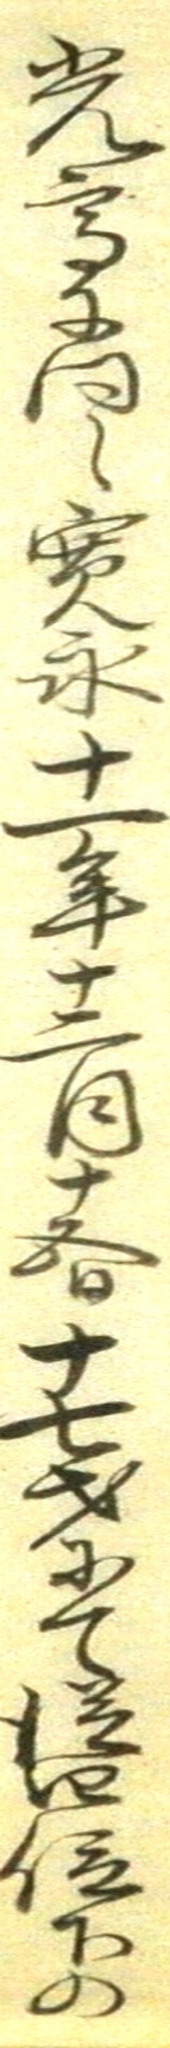光高に同し寛永十一年十二月十五日十七才にて従四位下の
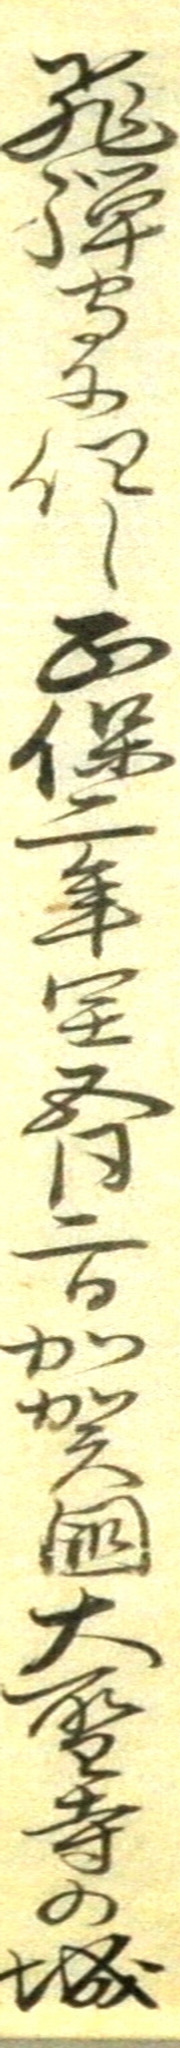飛騨守に任し正保二年閏五月二日加賀国大聖寺の城
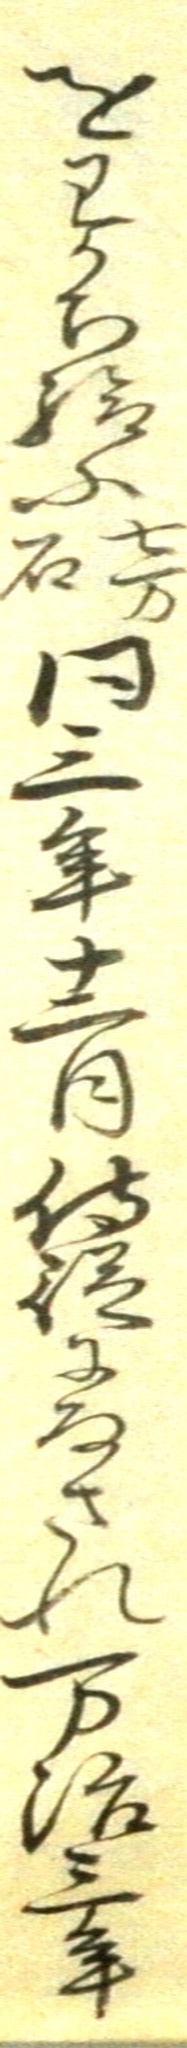をわかち給ふ七万石同三年十二月侍従になされ万治三年
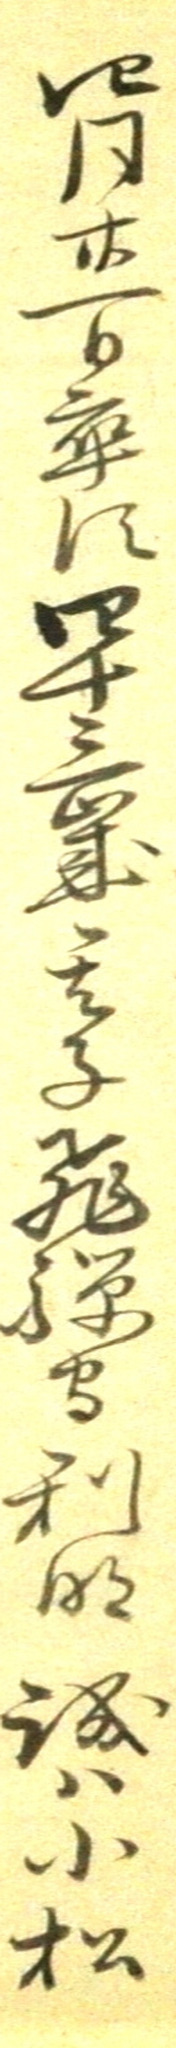四月廿一日卒す四十三歳其子飛騨守利明誠は小松
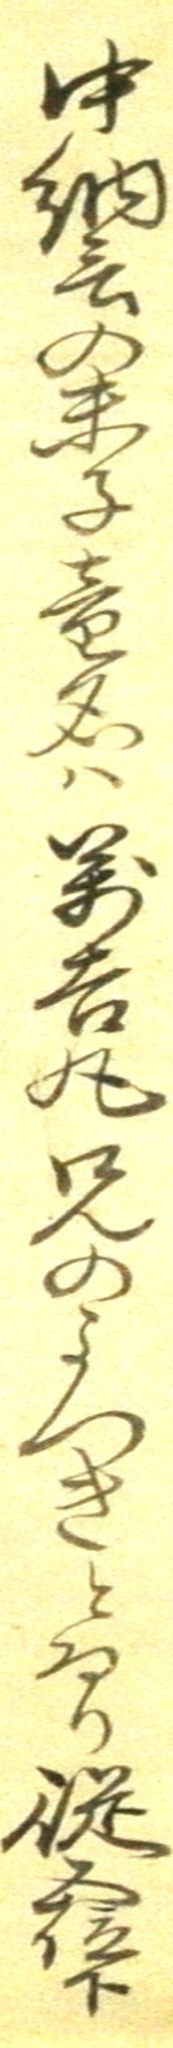中納言の末子童名は万吉丸兄のよつきとなり従五位下
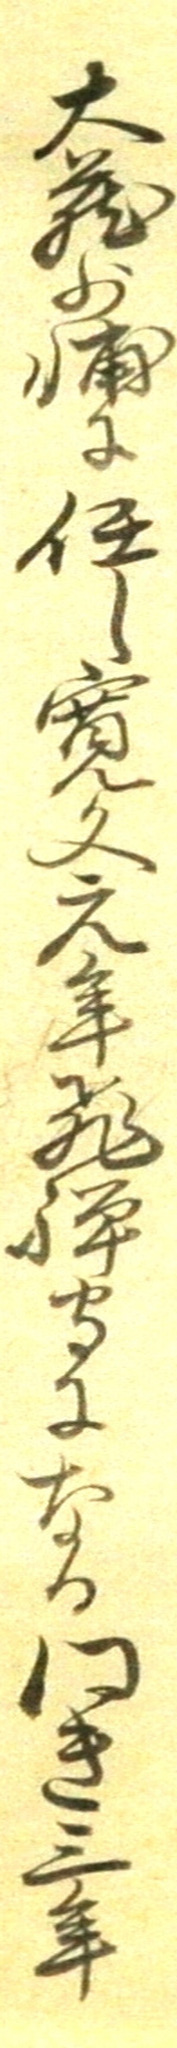大蔵少輔に任し寛文元年飛騨守になる同き三年
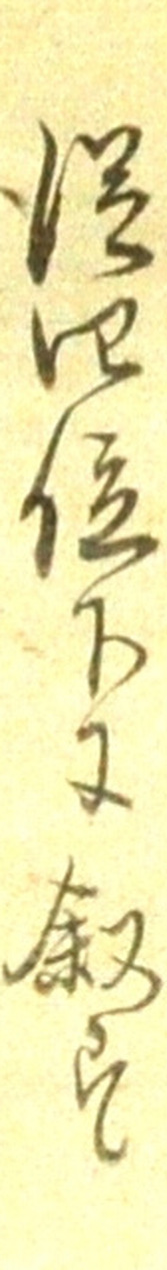従四位下に叙す
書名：藩翰譜（七・上）
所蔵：伊那市立高遠町図書館・合同会社AMANE
